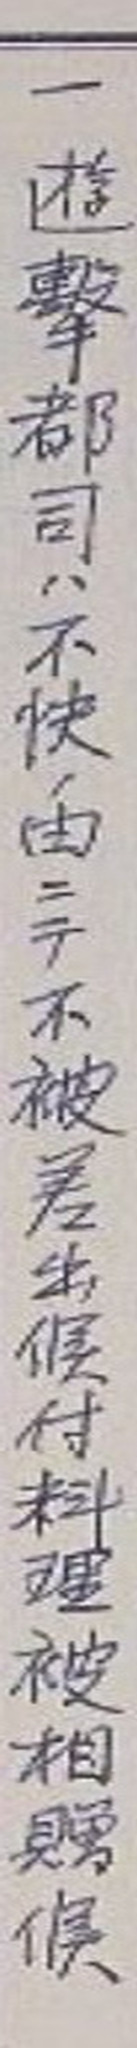一遊撃都司は不快の由にて不被差出候付料理被相贈候
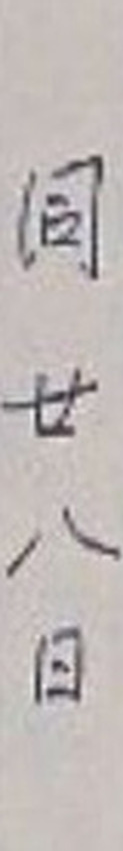同廿八日
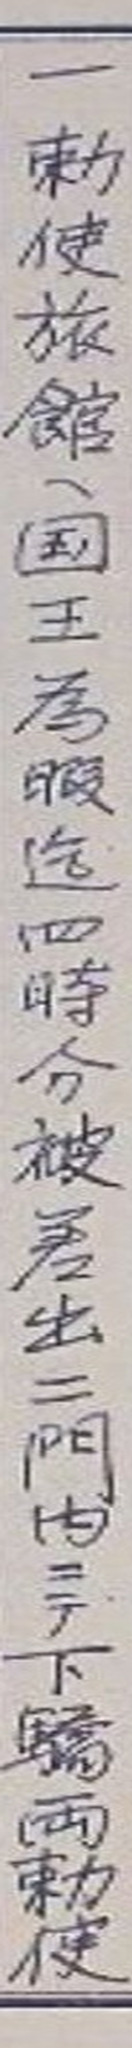一勅使旅館へ国王為暇迄四時分被差出二門内にて下轎両勅使
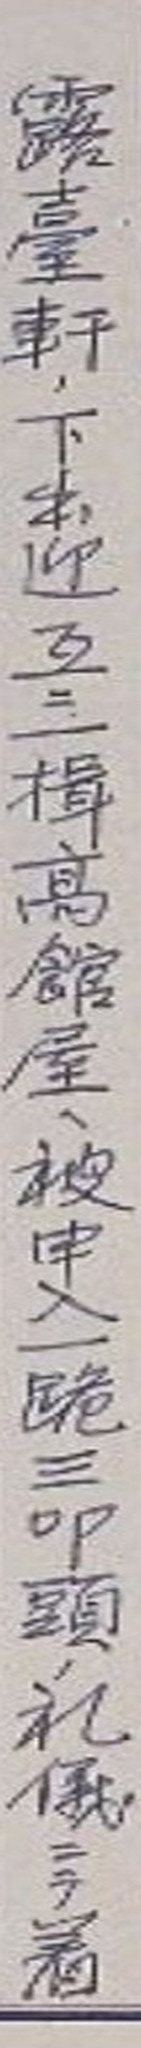露台軒の下出迎互に一揖高館屋へ被申入一跪三叩頭の礼儀にて着
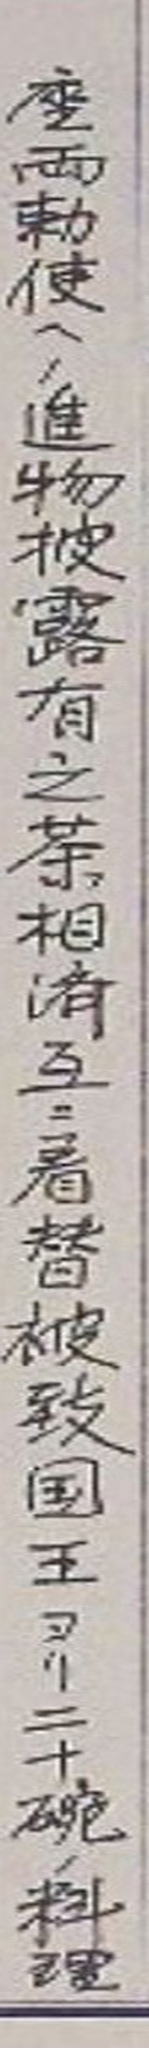座両勅使への進物披露有之茶相済互に着替被致国王より二十碗の料理
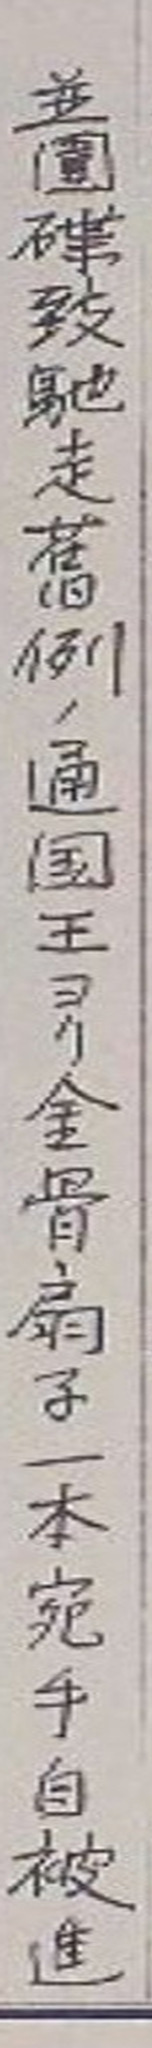並囲碟致馳走旧例の通国王より金骨扇子一本宛手自被進

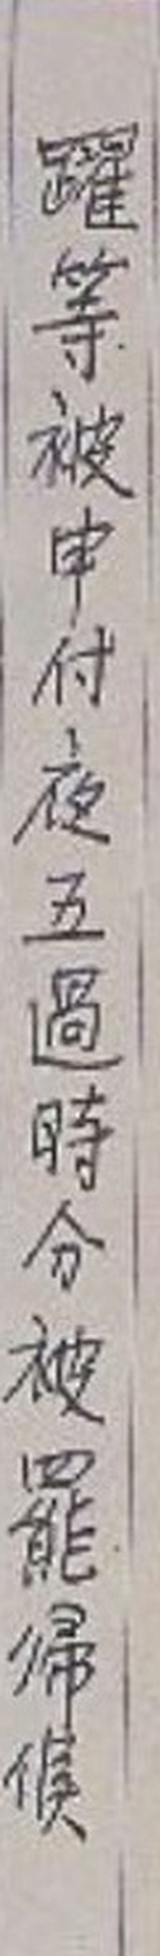躍等被申付夜五過時分被罷帰候
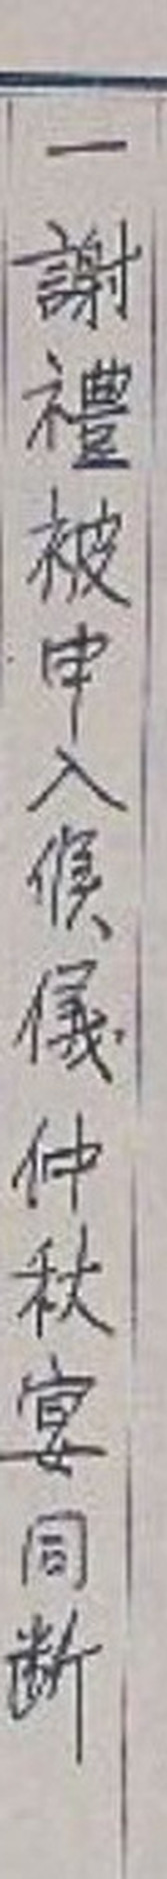一謝礼被申入候儀仲秋宴同断
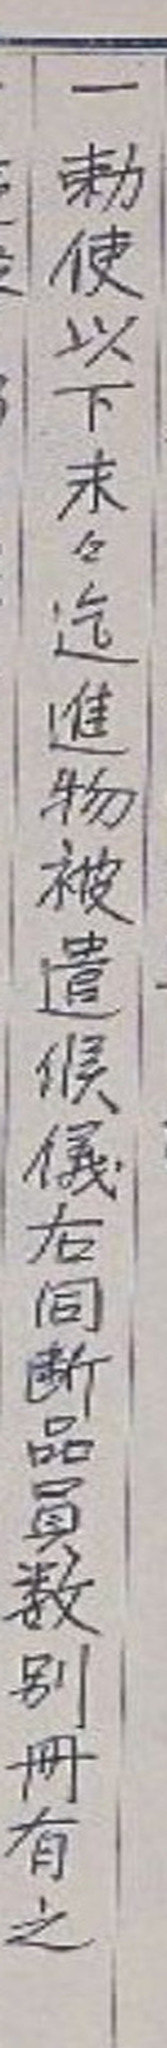一勅使以下末々迄進物被遣候儀右同断品員数別冊有之
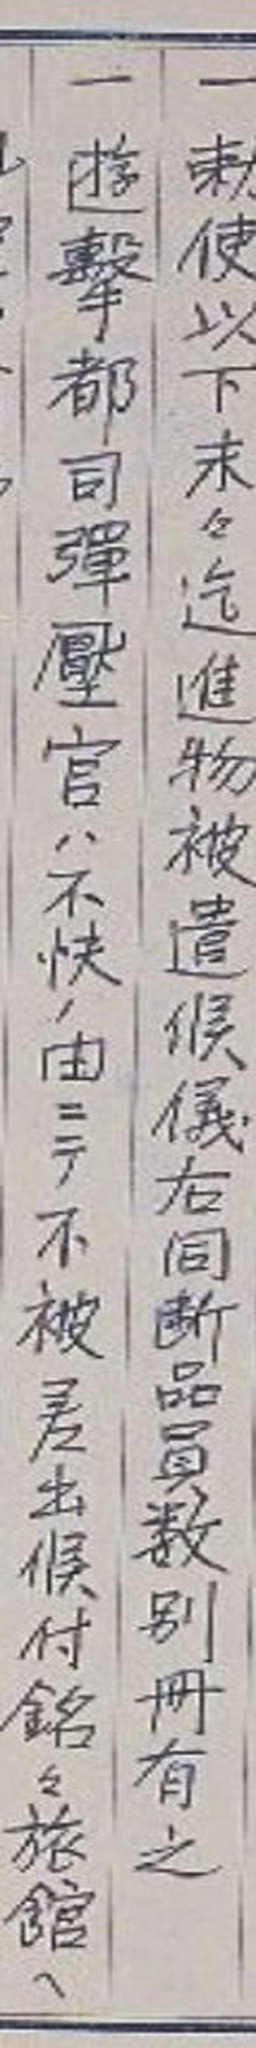一遊撃都司弾圧官は不快の由にて不被差出候付銘々旅館へ
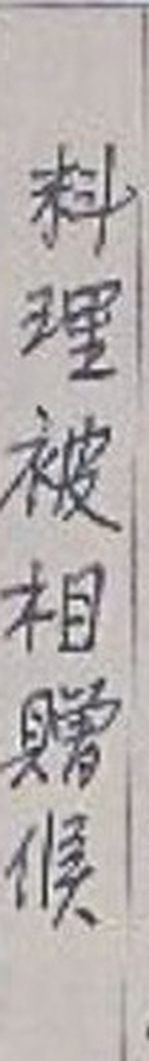料理被相贈候
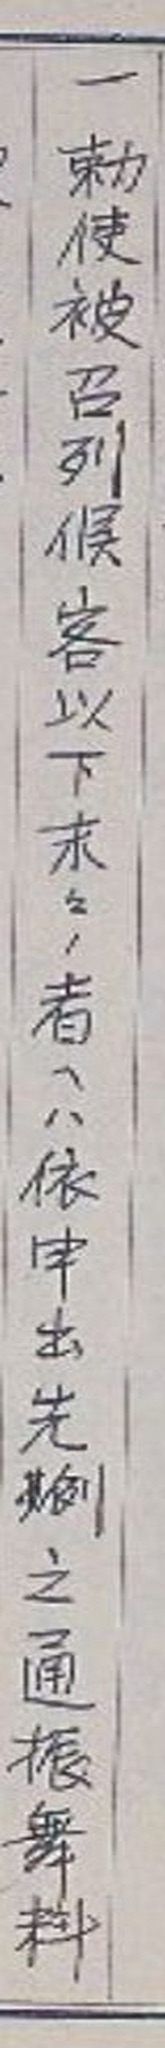一勅使被召列候客以下末々の者へは依申出先例之通振舞料
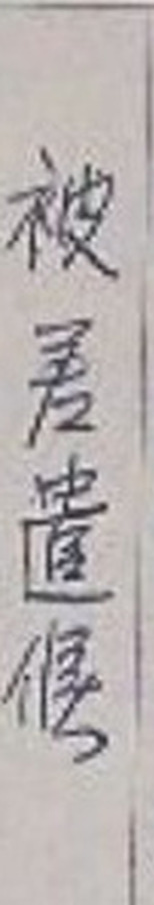被差遣候
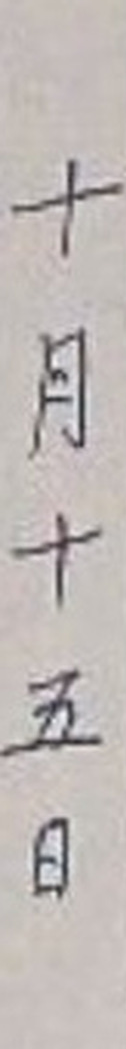十月十五日
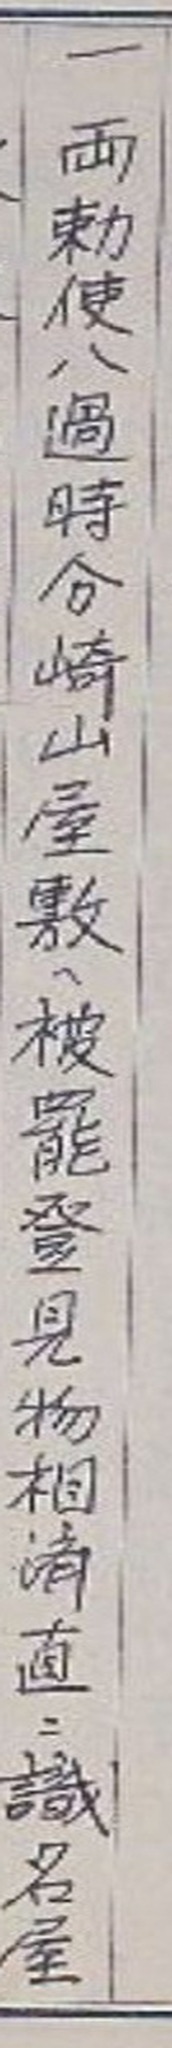一両勅使八過時分崎山屋敷へ被罷登見物相済直に識名屋
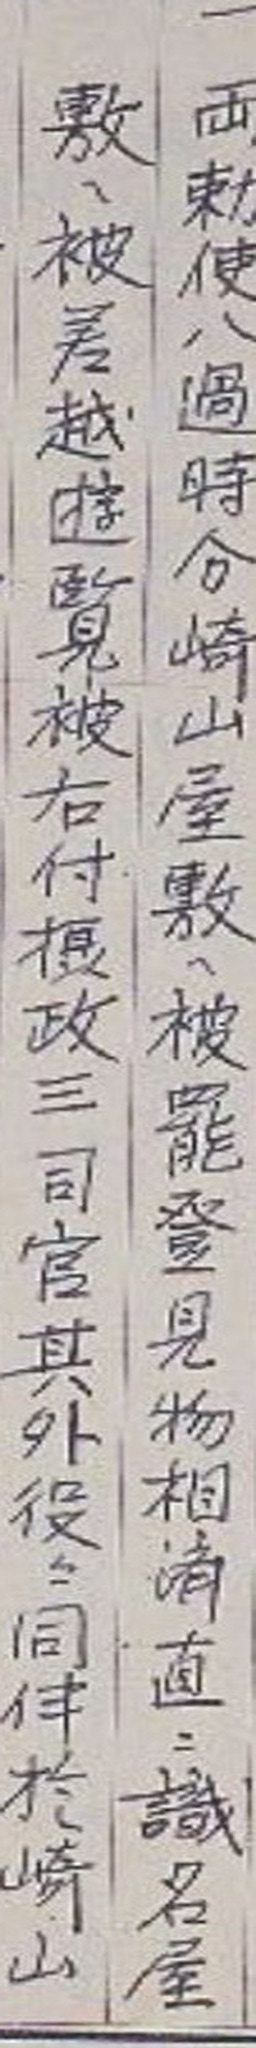敷へ被差越遊覧被右付摂政三司官其外役々同伴於崎山
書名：支那冊封使来琉諸記 下巻
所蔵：University of the Ryukyus Library
